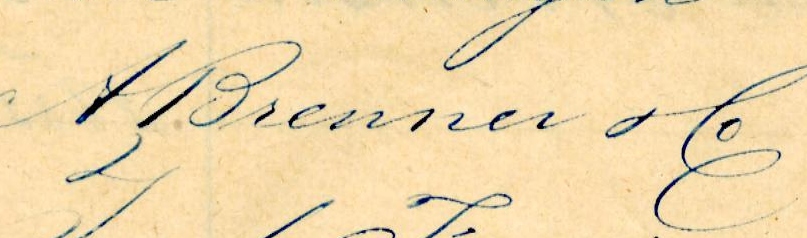A Brenner & Co
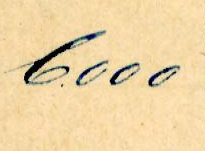6.000
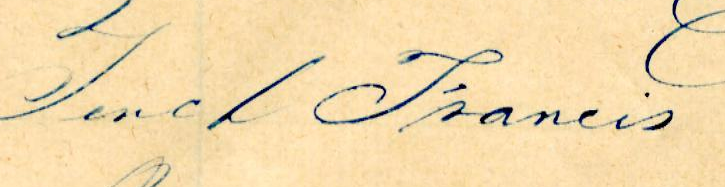Tench Francis
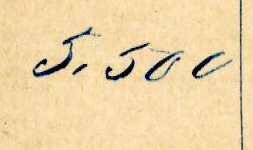5,500
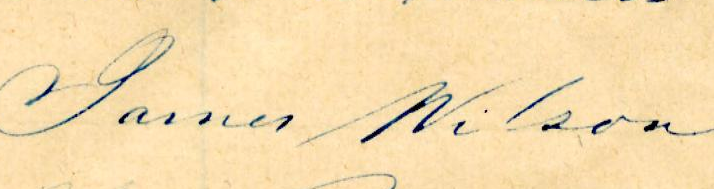James Wilson
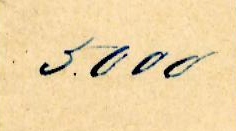5.000
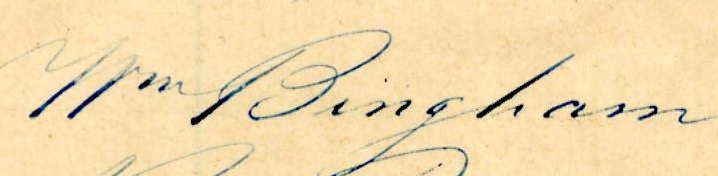W^m Bingham
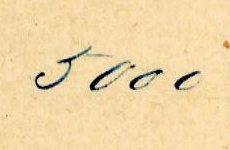5000
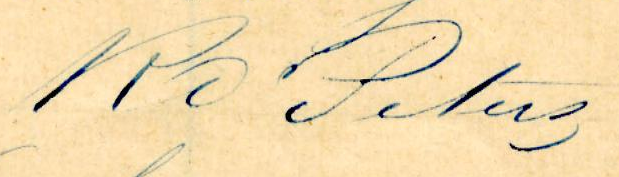Ro Peters
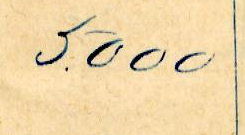5.000
